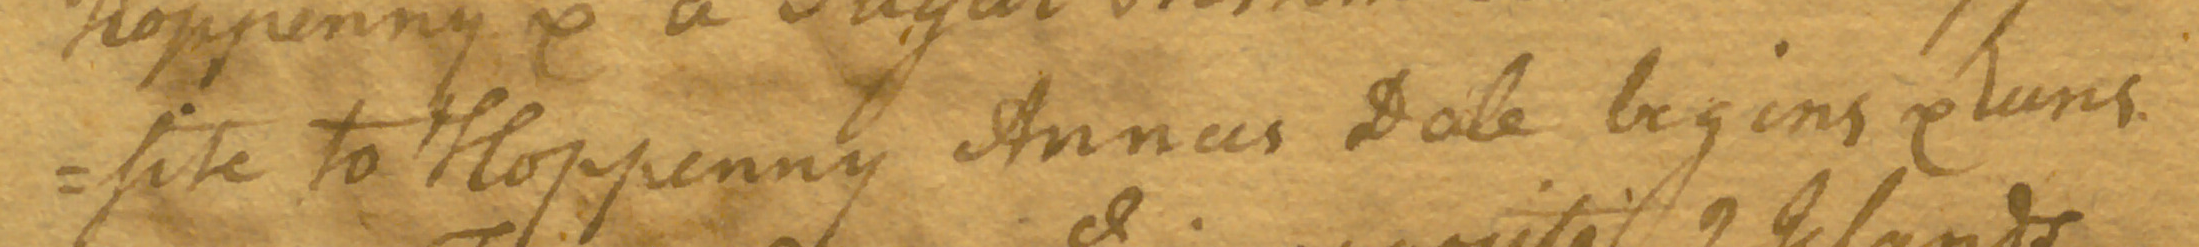-site to Hoppenny Annas Dale begins & runs
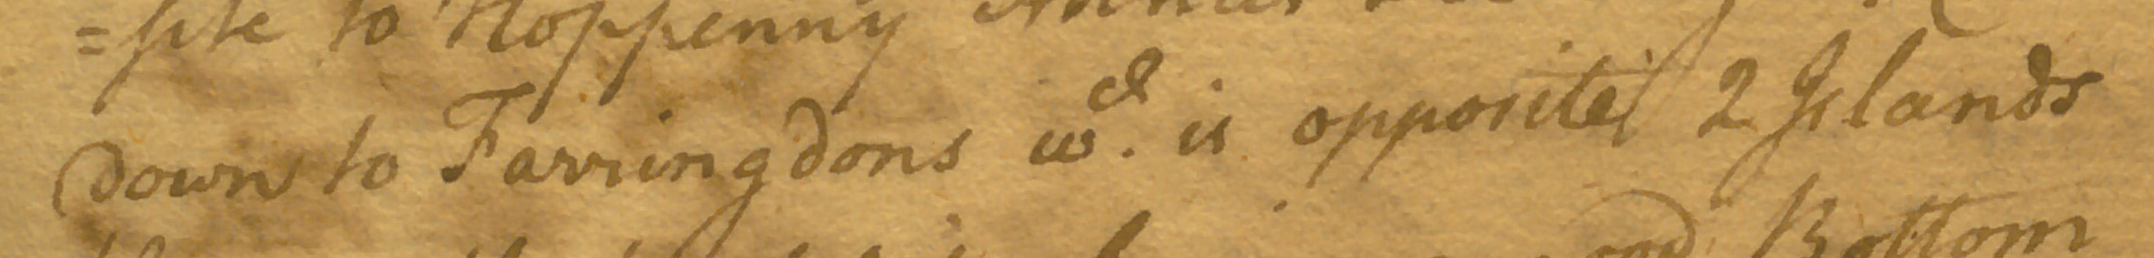down to Farringdons w^ch. is opposite 2 Islands
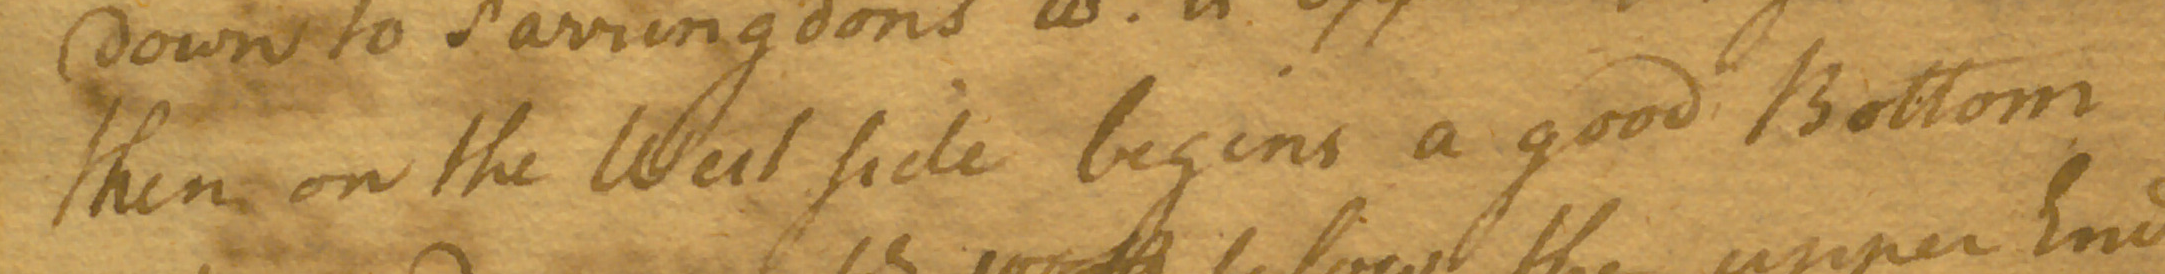then on the West side begins a good Bottom
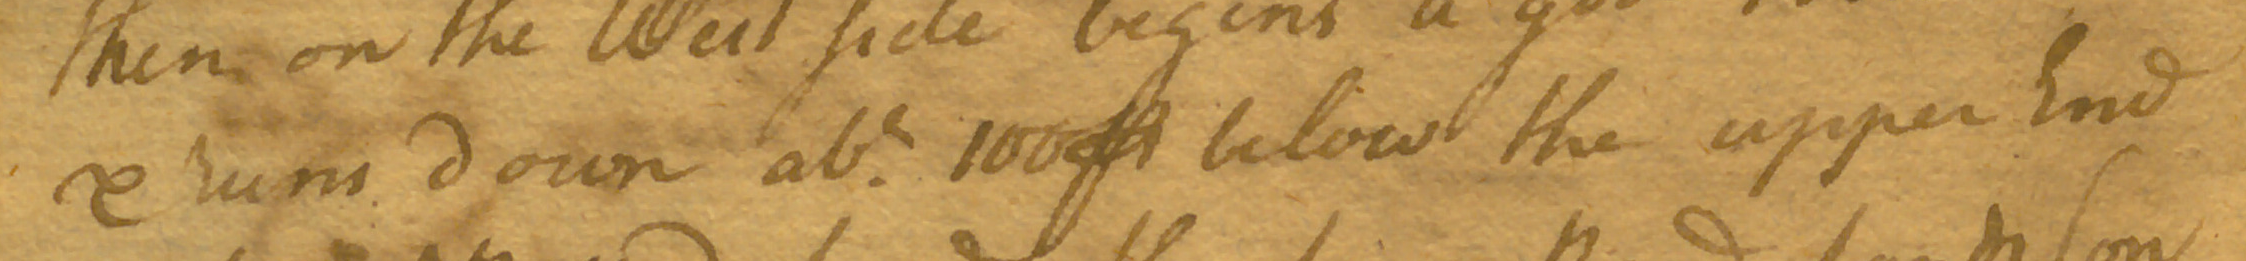& runs down ab^t. 100 per below the upper End
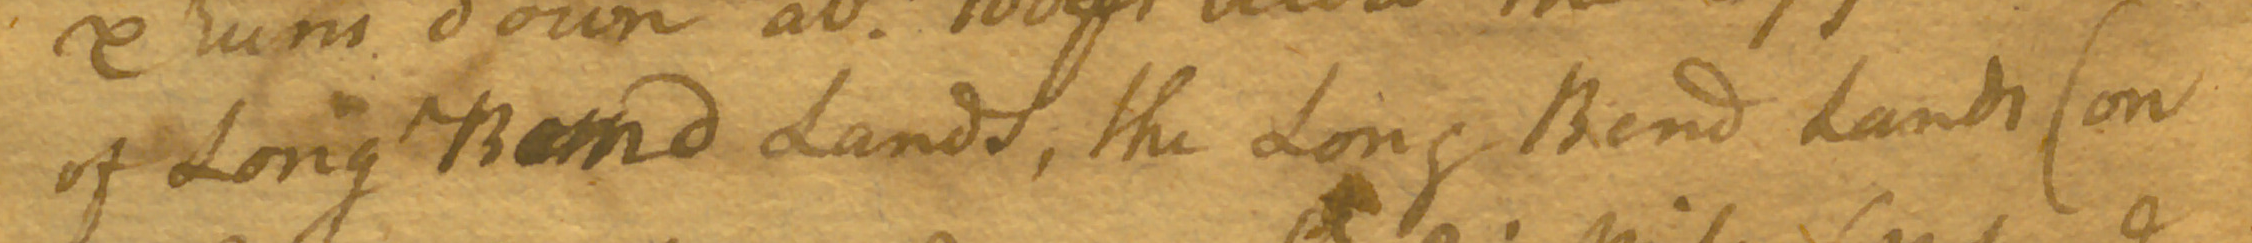of Long Bend Lands, the Long Bend Lands (on
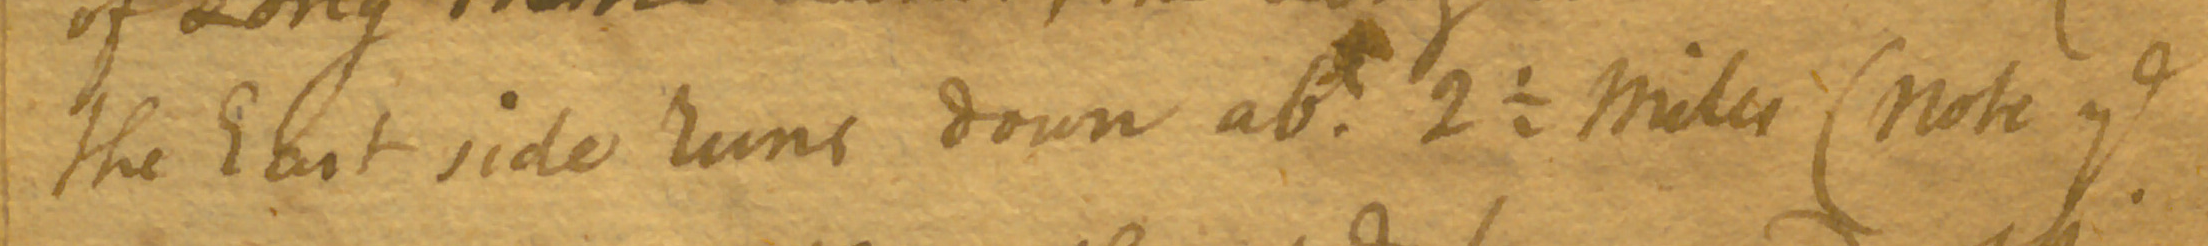the East side runs down ab^t. 2 1/2 miles (note y^e
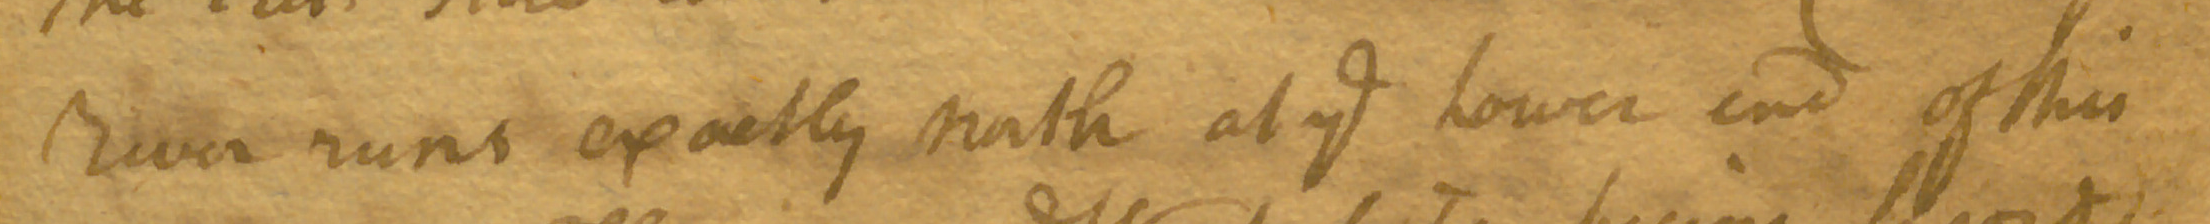river runs exactly north at y^e Lower end of this
